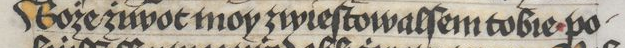Boże żiwot moy zwieſtowalſem tobie.po¬
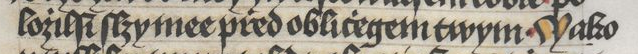lożilſi ſlzy mee pṙed obliċegem twym.Yako
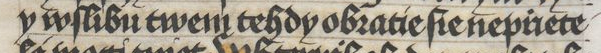y wſlibu twem tehdy obratíe ſie nepṙiete¬
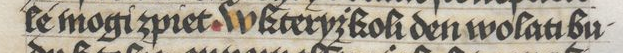lé mogi zpiet.Wkteryżkoli den wolati bu¬
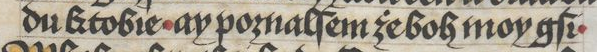du ktobie.ay poznalſem że boh moy gſi.
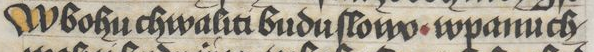Wbohu chwaliti budu ſlowo.wpanu ch¬
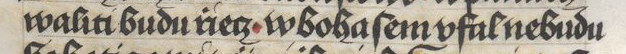waliti budu ṙiecz.w boha ſem vſal nebudu
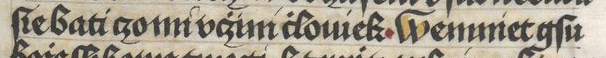ſie bati czomi vcżiní ċlouiek.Wemniet gſu
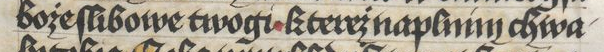boże ſlibowe twogi.ktereż naplním chwa¬
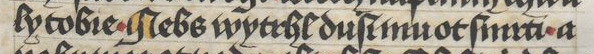ly tobie.Nebs wytrhl duẛi mu ot ſmrti.a
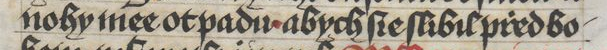nohy mee ot padu.abych ſie ſlibil pṙed bo¬
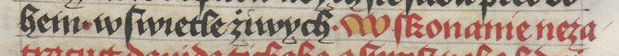hem.w ſwietle żiwych.Wſkonanie neza¬
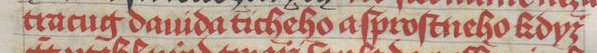tracug dauida ticheho a ſproſtneho kdyż
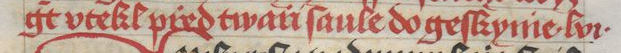ḡt vtekl pṙed twaṙi ſaule do geſkynie.lvi.
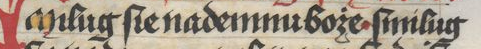Milug ſie nademnu boże.ſmilug
